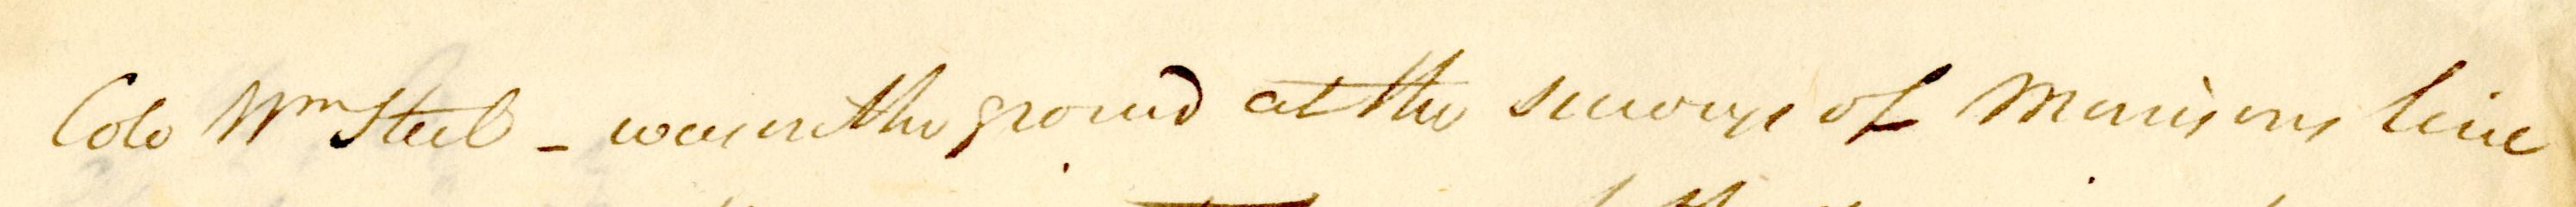Colo W^m Steel- was in the ground at the survey of masuring line
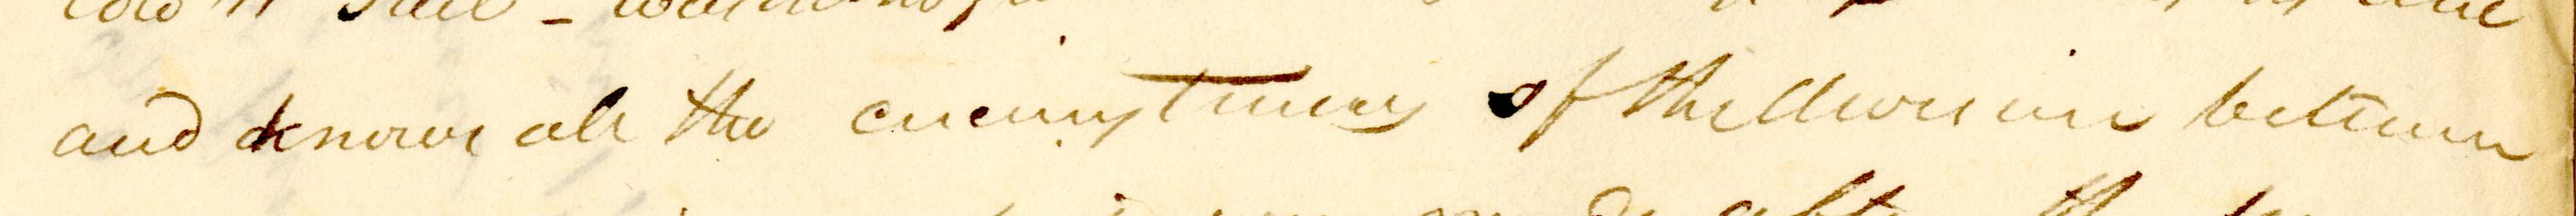and knows all the circumstances of the River line between
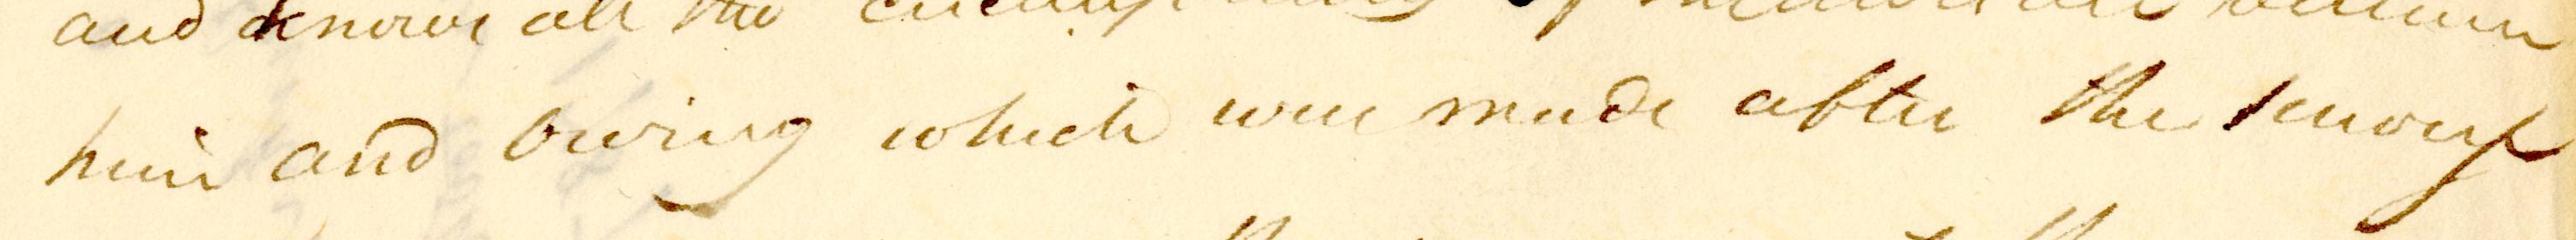him and bring which were made after the survey
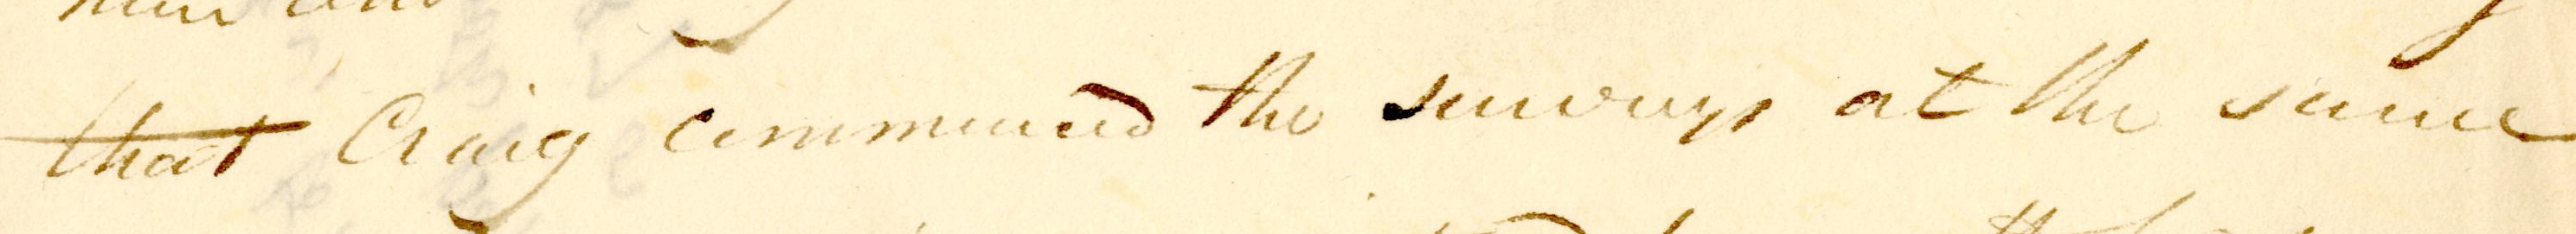that Craig commenced the surveys at the same
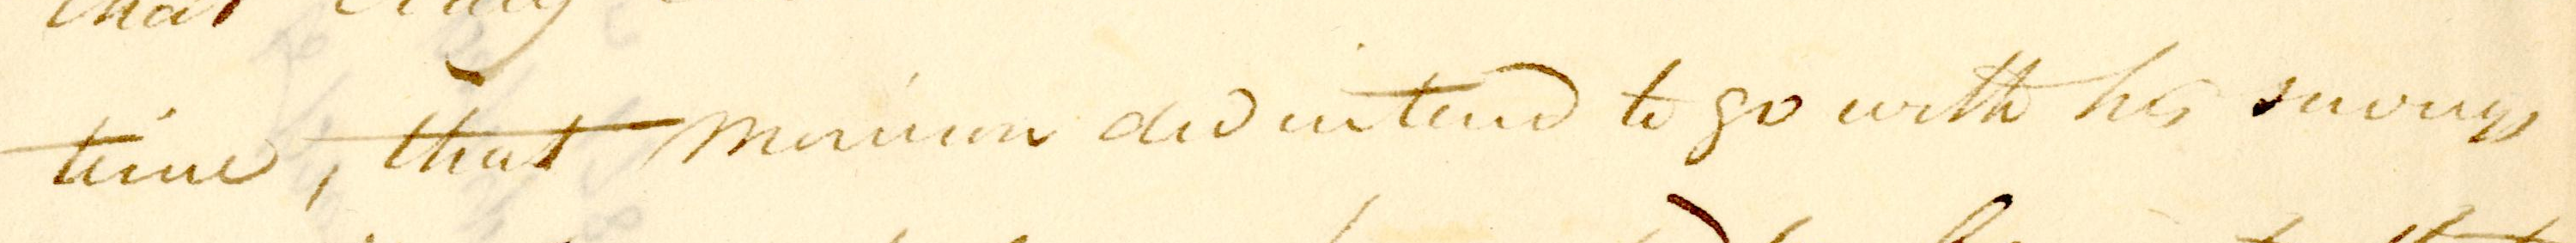time, that Morison did intend to go with his survey
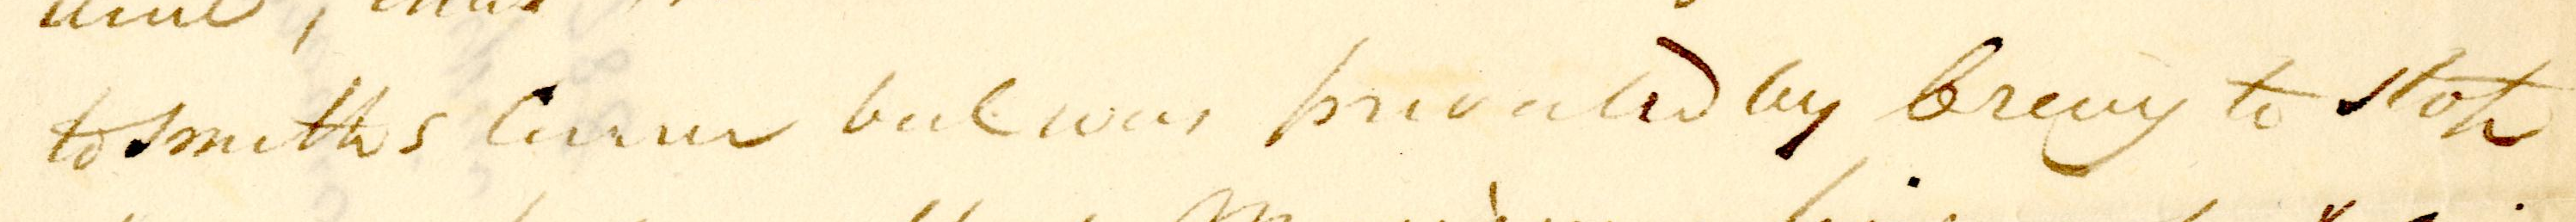to smiths care but was prevented by Craig to stop
